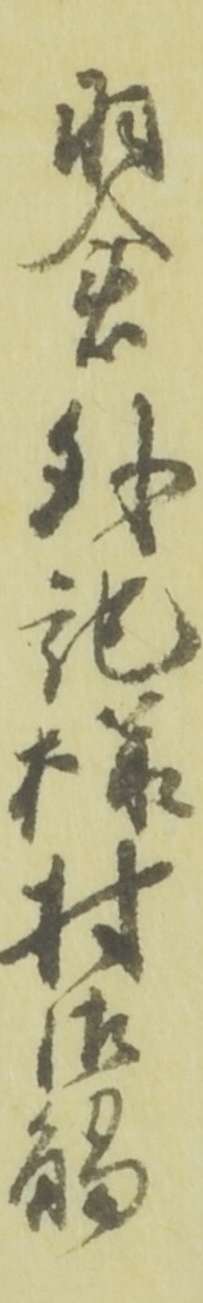羽倉外記様村御触
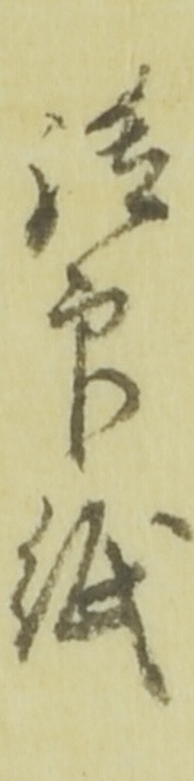御印紙
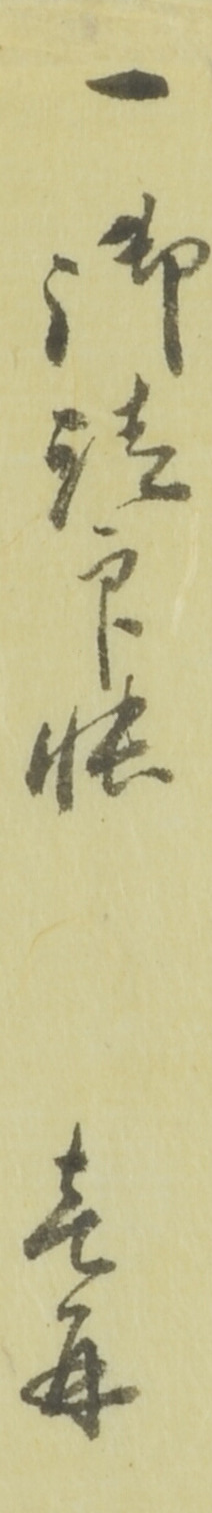一御請印帳壱冊
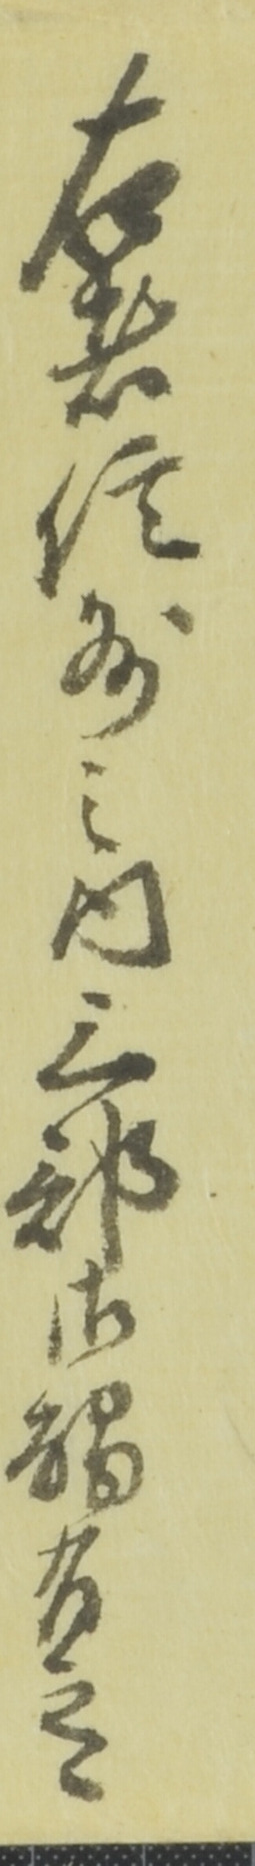右は信州之内三郡御触有之候
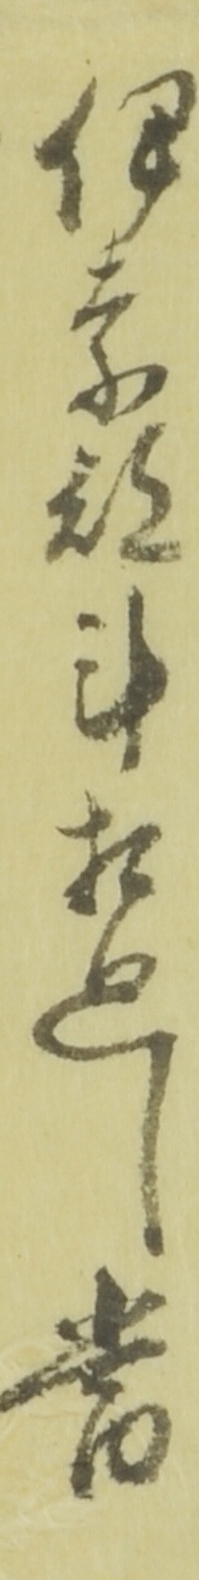伊奈郡計相廻候当
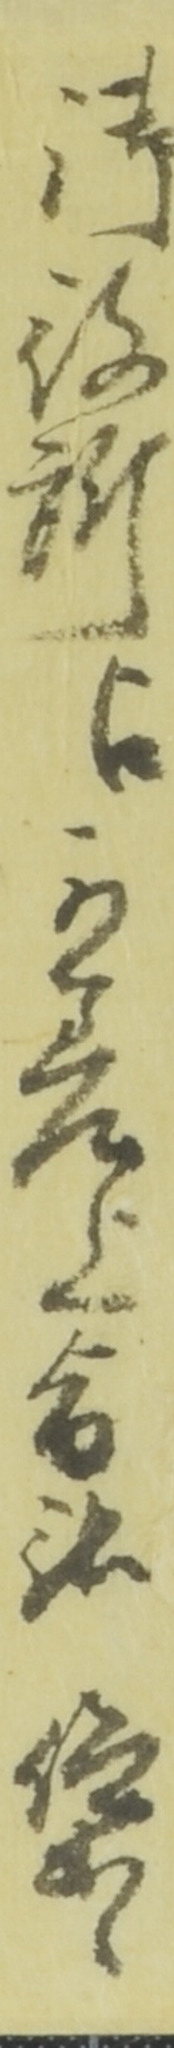御役所江可差上旨被仰出候
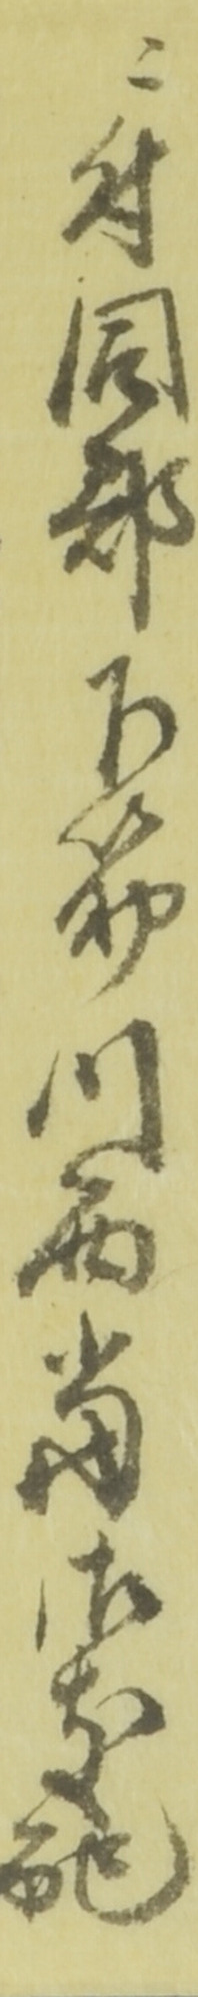ニ付同郡下筋川西当御支配
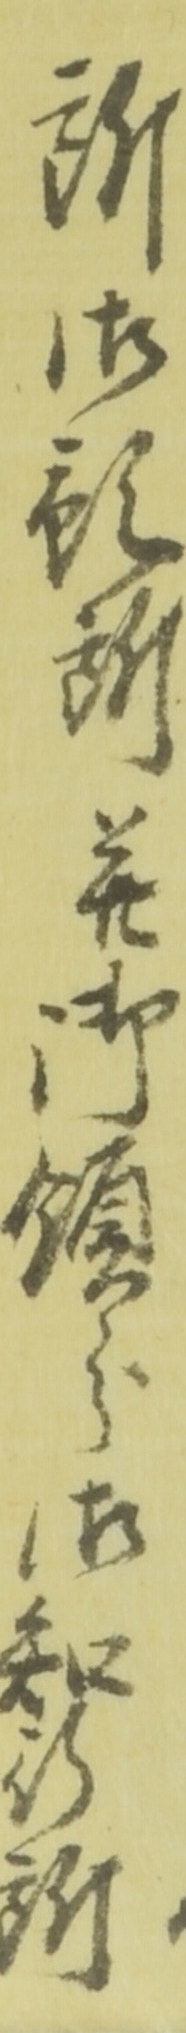所御預所并御領分御知行所
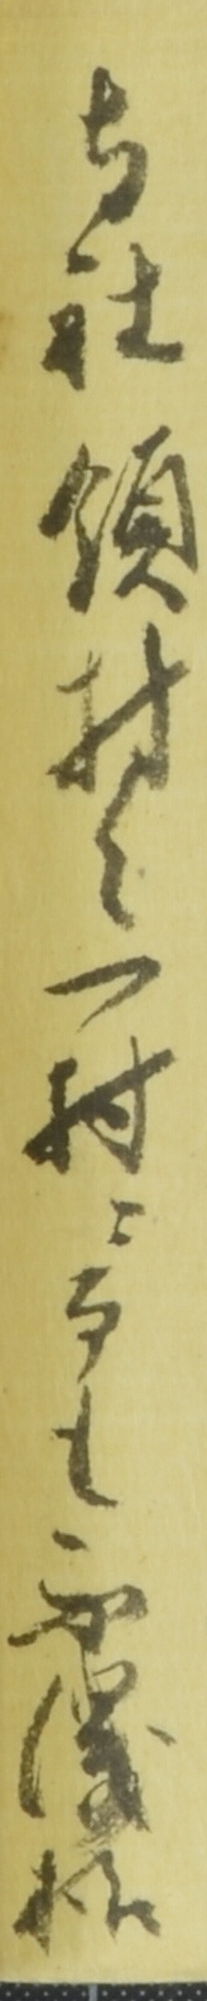寺社領村々一村ニ而も不洩様
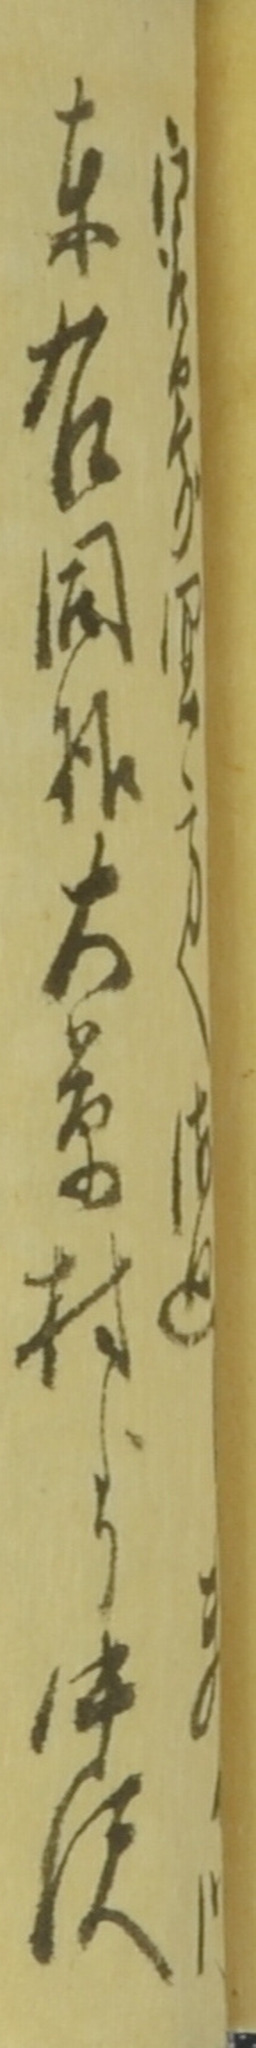東右同様大暮村より中沢
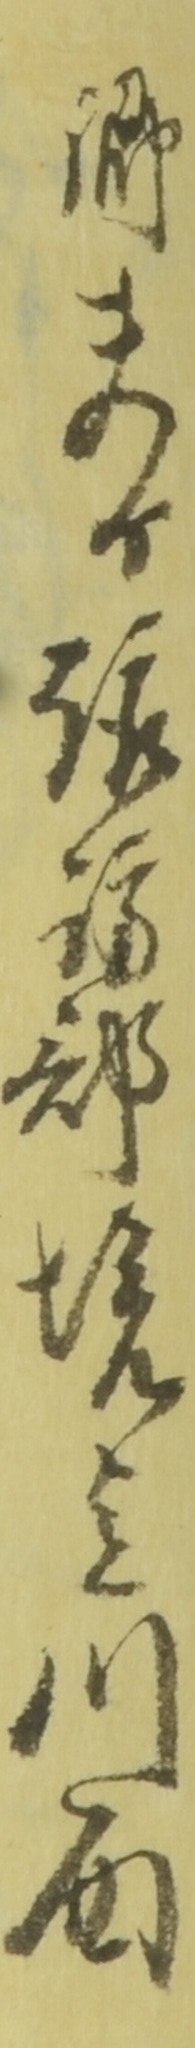郷夫ゟ諏訪郡境迄川面
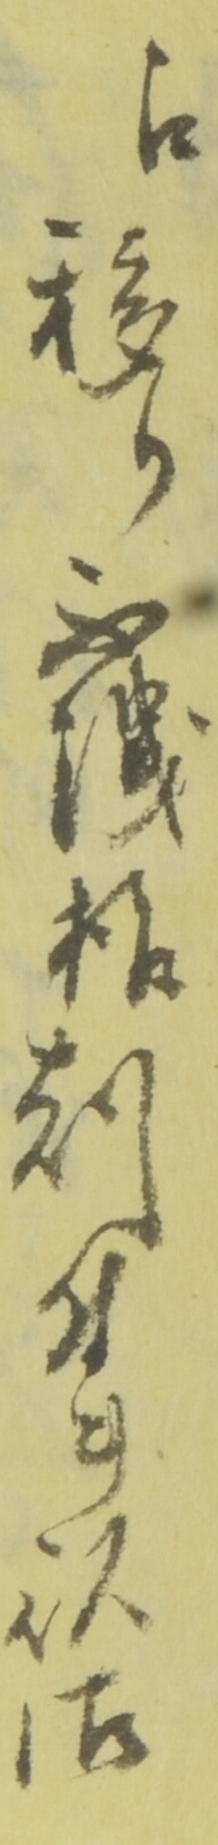江移り不洩様刻付ヲ以御

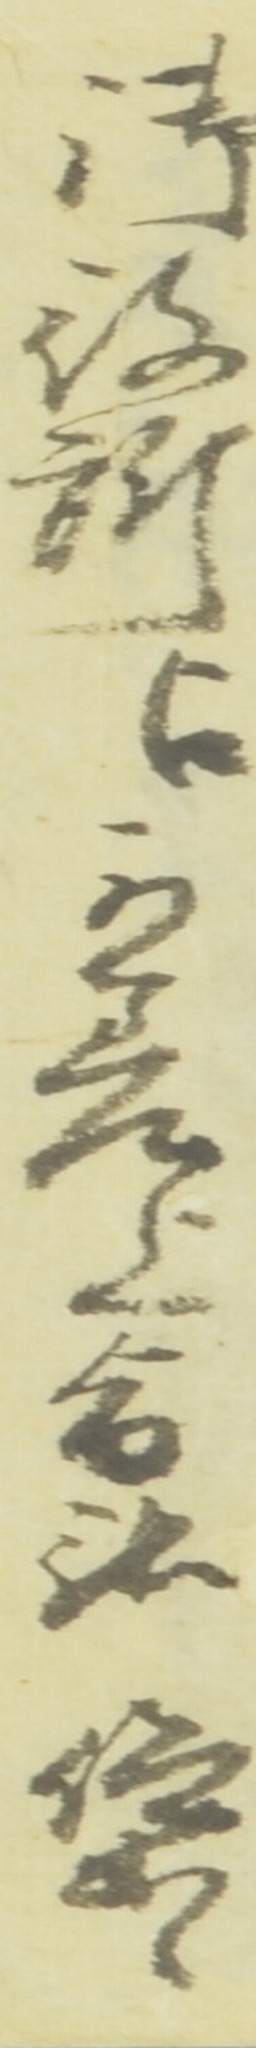御役所江可差上旨被仰出候
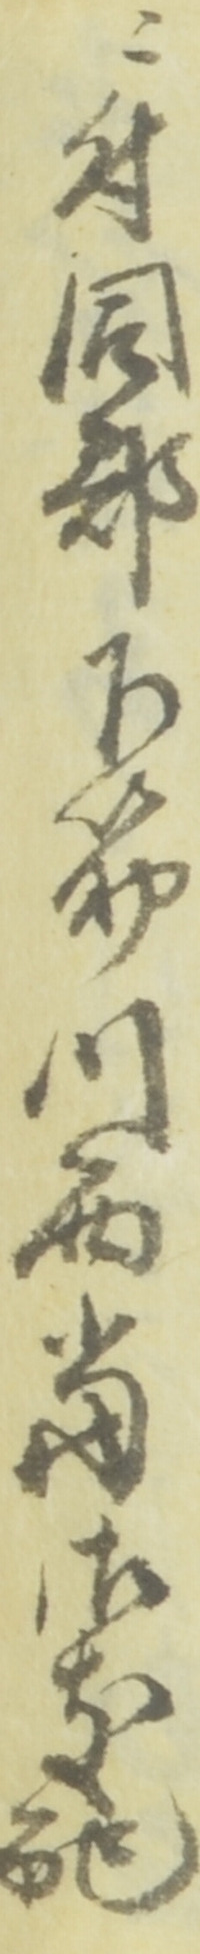ニ付同郡下筋川西当御支配
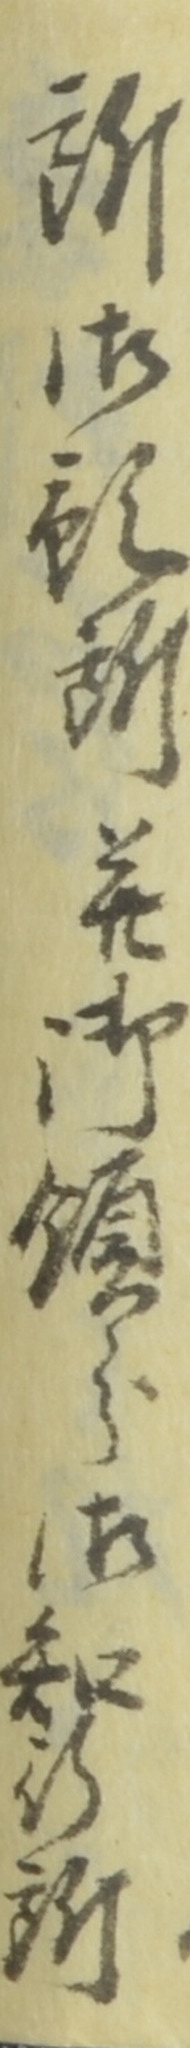所御預所并御領分御知行所
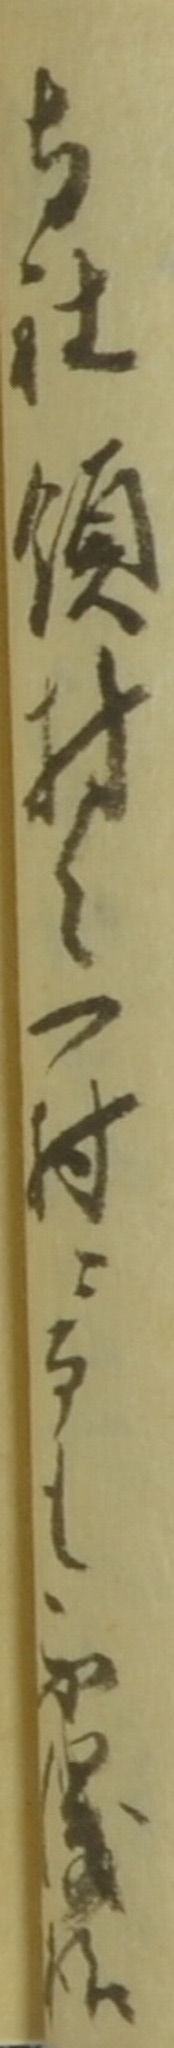寺社領村々一村ニ而も不洩様
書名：御触書御書附控
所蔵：伊那市立高遠町図書館・合同会社AMANE
